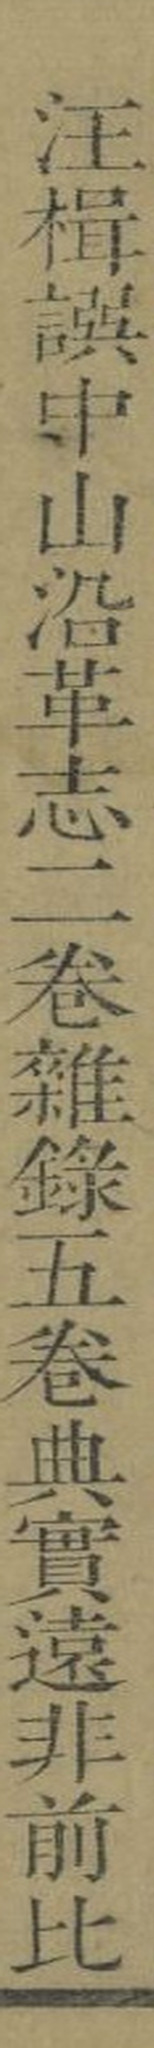汪楫譔中山沿革志二卷雜錄五卷典實遠非前比
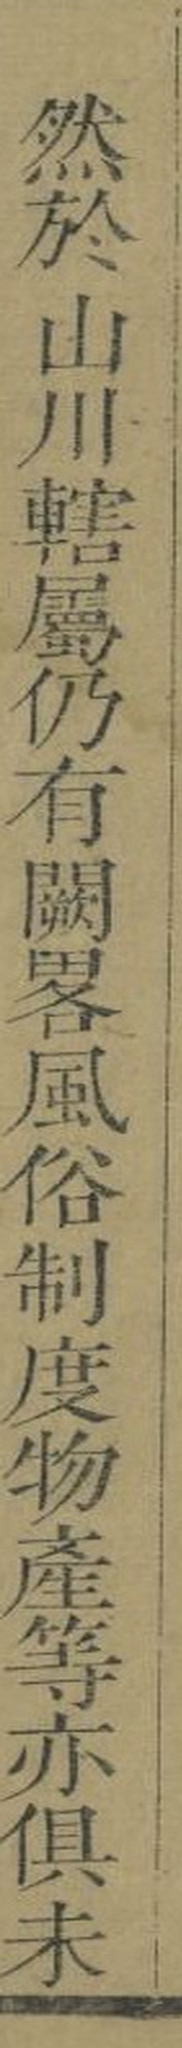然於山川轄屬仍有闕畧風俗制度物產等亦俱未
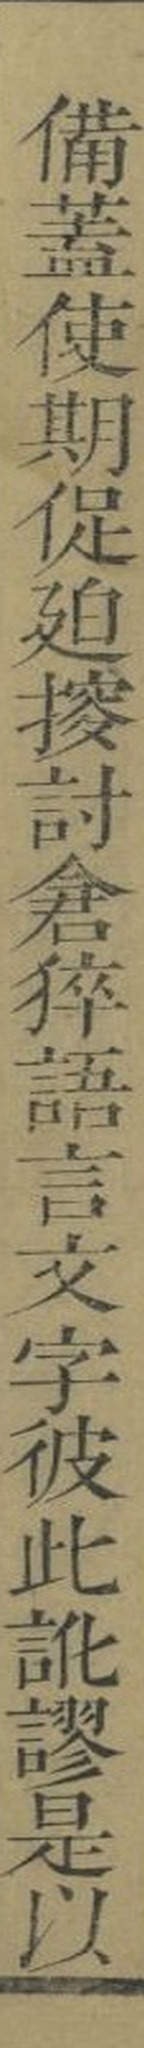備蓋使期促廹摉討倉猝語言文字彼此訛謬是以
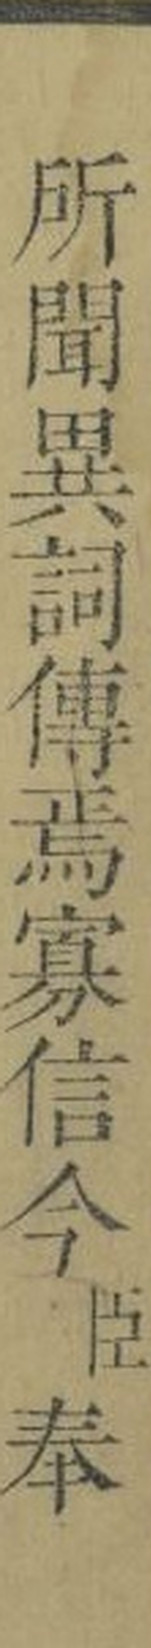所聞異詞傳焉寡信今臣奉
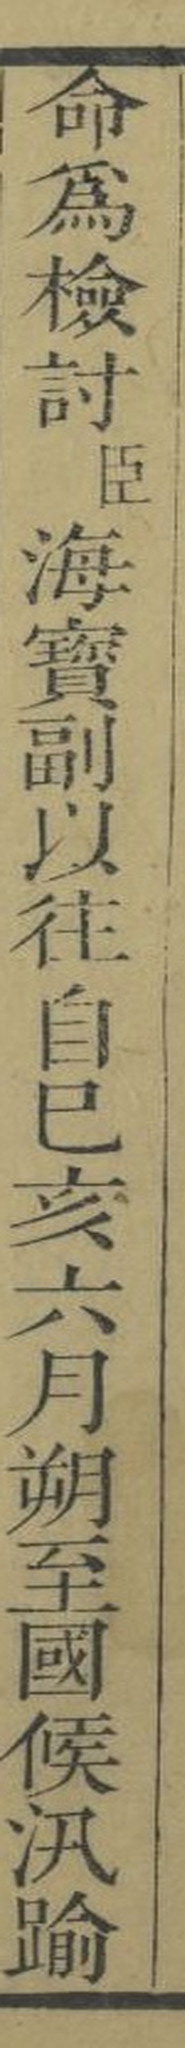命爲檢討臣海寳副以往自巳亥六月朔至國候汛踰
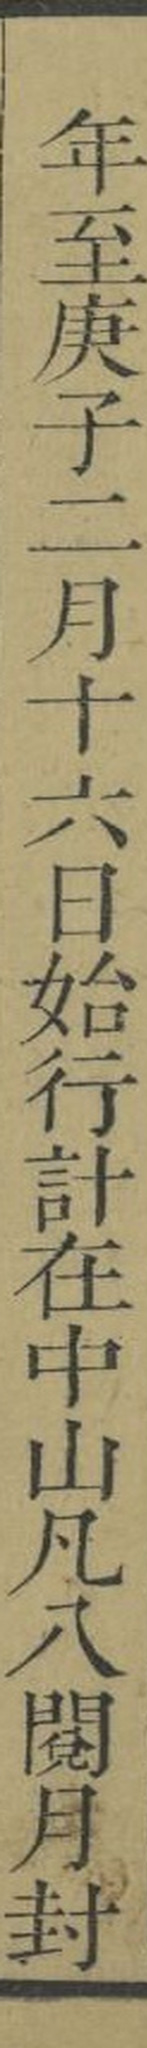年至庚子二月十六日始行計在中山凡八閱月封
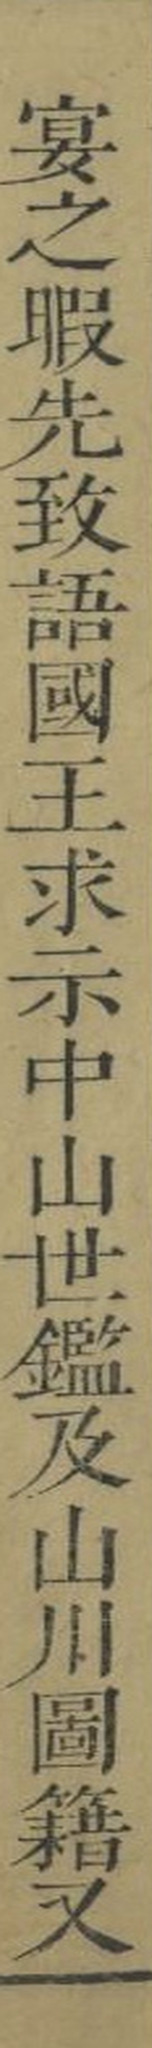宴之暇先致語國王求示中山世鑑及山川圖籍又
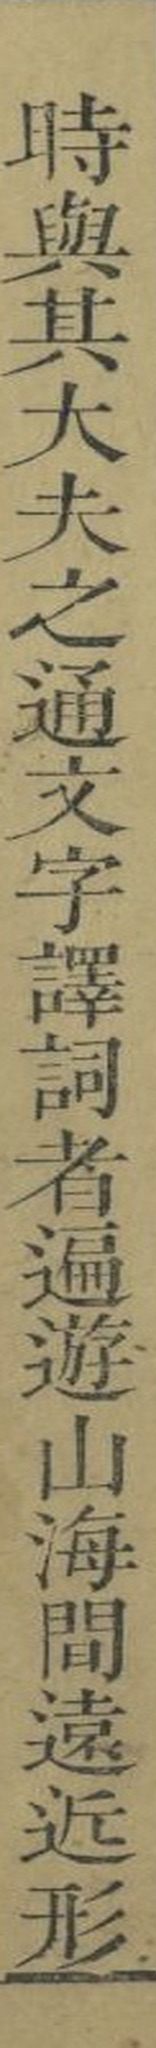時與其大夫之通文字譯詞者遍遊山海間遠近形
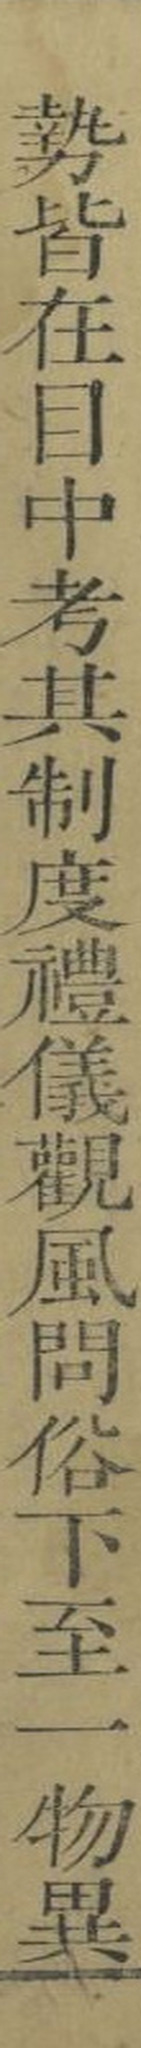勢皆在目中考其制度禮儀觀風問俗下至一物異
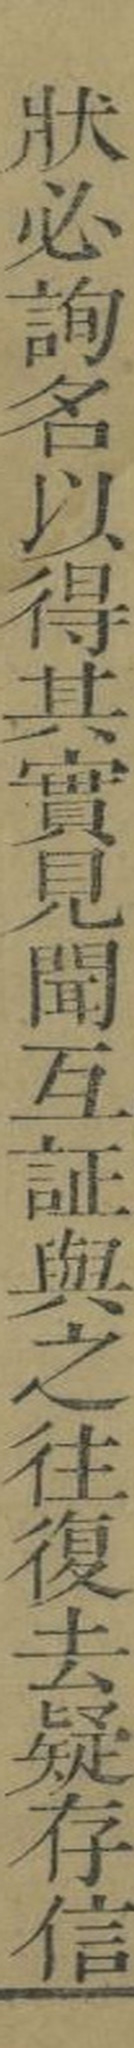狀必詢名以得其實見聞互証與之往復去疑存信
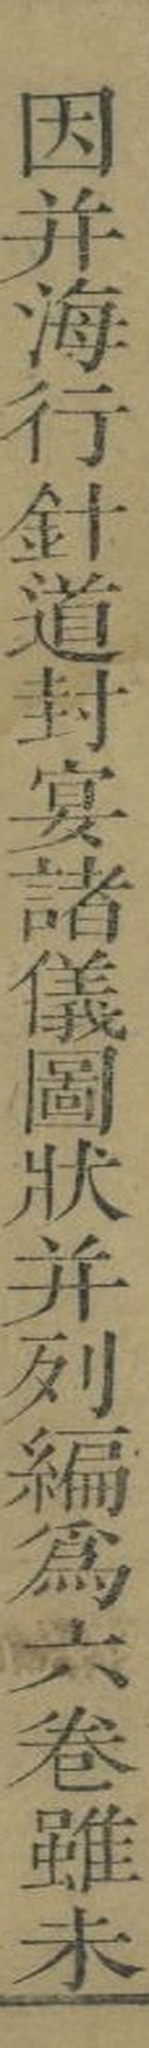因并海行針道封宴諸儀圖狀并列編爲六卷雖未
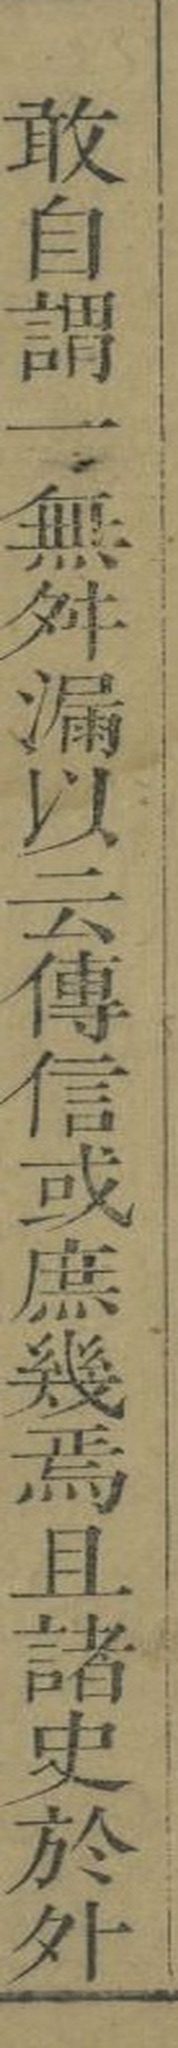敢自謂一無舛漏以云傳信或庶幾焉且諸史於外
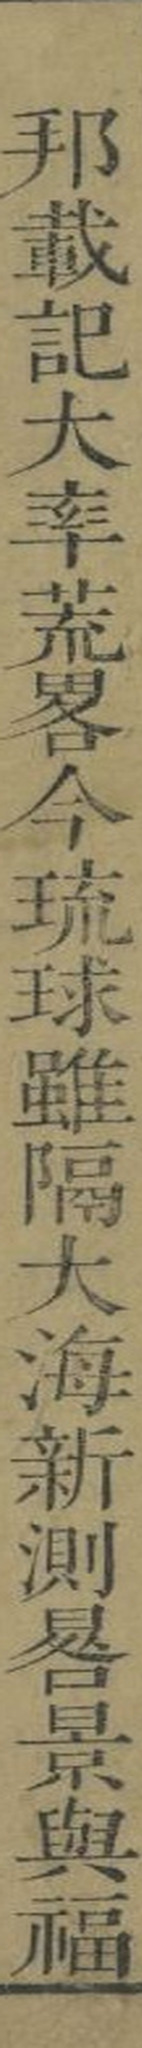邦載記大率荒畧今琉球雖隔大海新測晷景與福
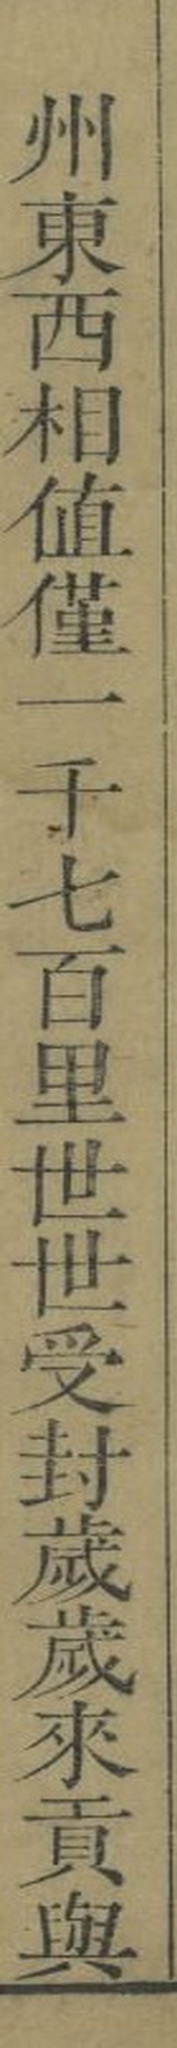州東西相値僅一千七百里世世受封歲歲來貢與
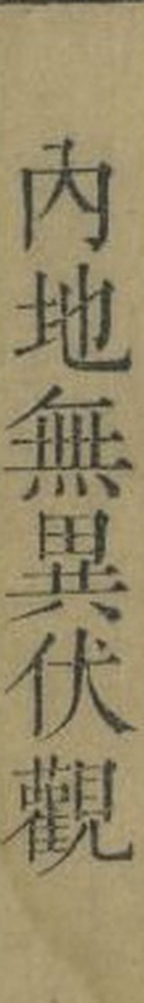内地無異伏觀

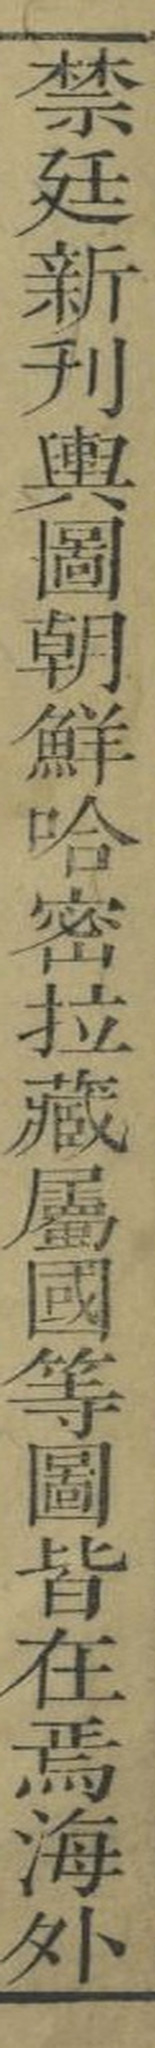禁廷新刊輿圖朝鮮哈密拉藏屬國等圖皆在焉海外
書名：中山伝信録 巻一
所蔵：University of the Ryukyus Library
